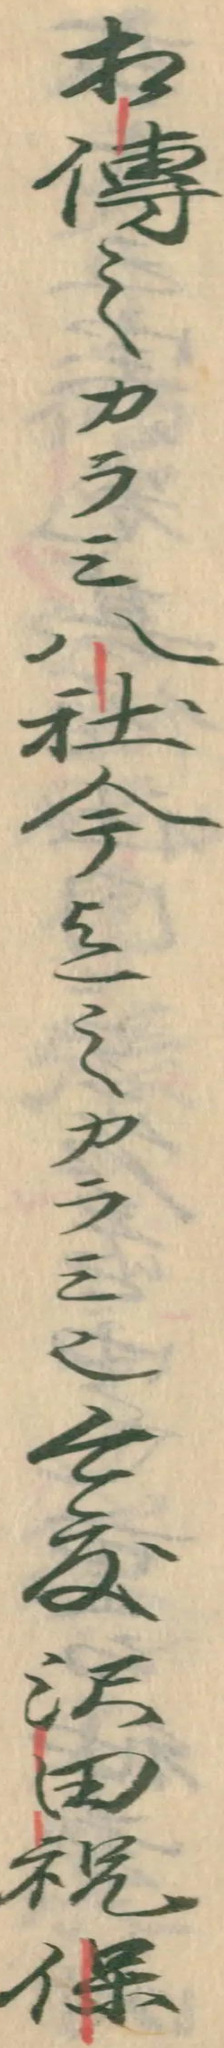相-伝之カラミ八-社今迄之カラミ也今度沢_田_祝保
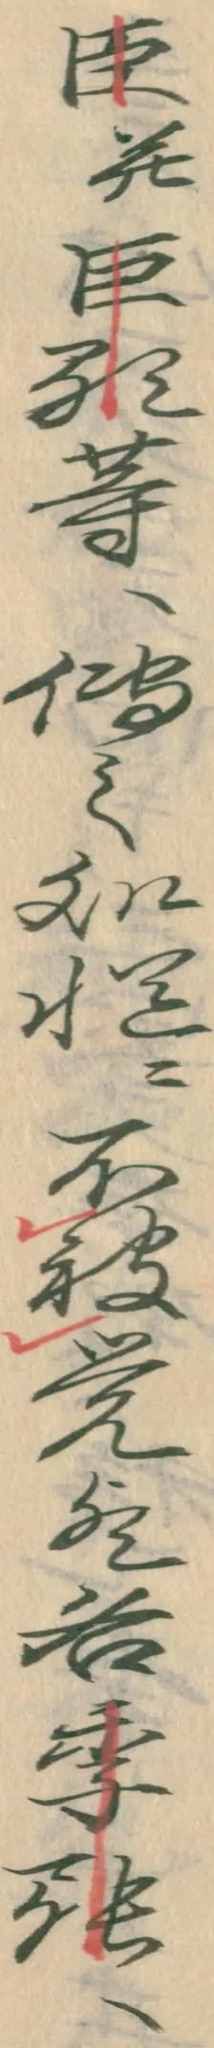臣并巨顕等へ伝之処慥ニ不被覚歟各季張へ
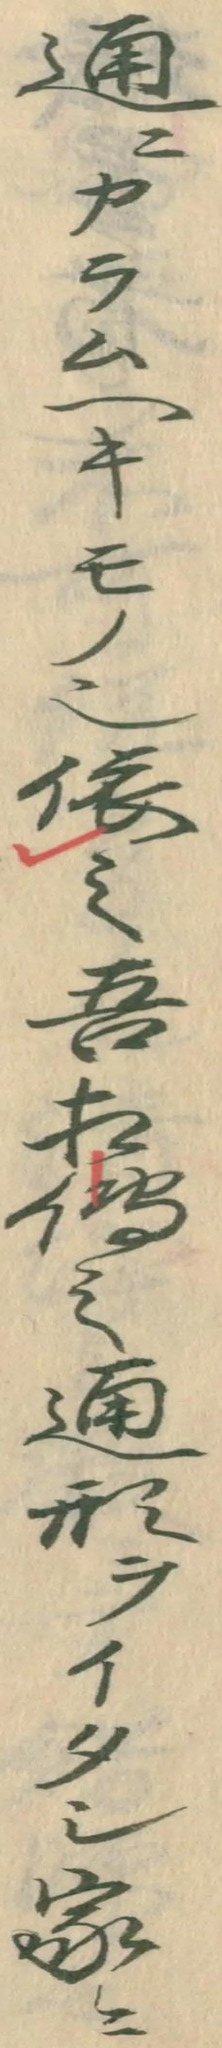通ニカラムヘキモノ也依之吾相-伝之通形ヲイタシ家ニ

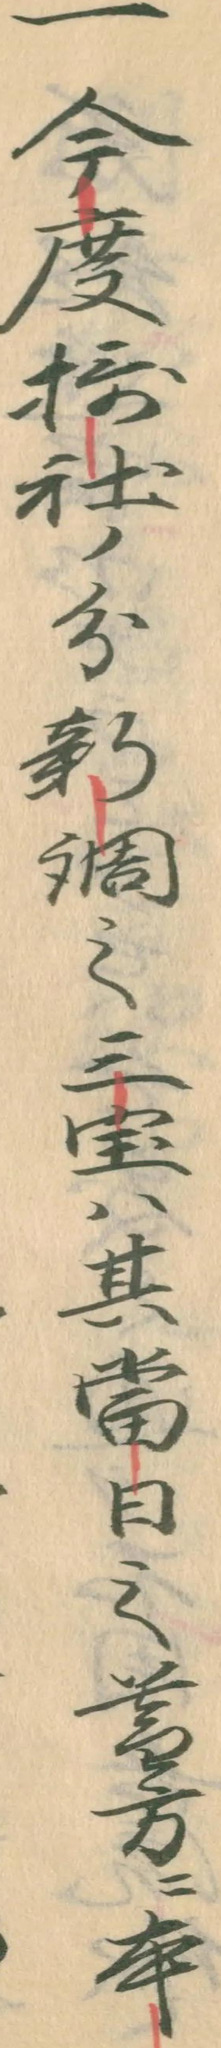一今-度摂-社ノ分新-調之三-宝ハ其当-日之暮方ニ本-
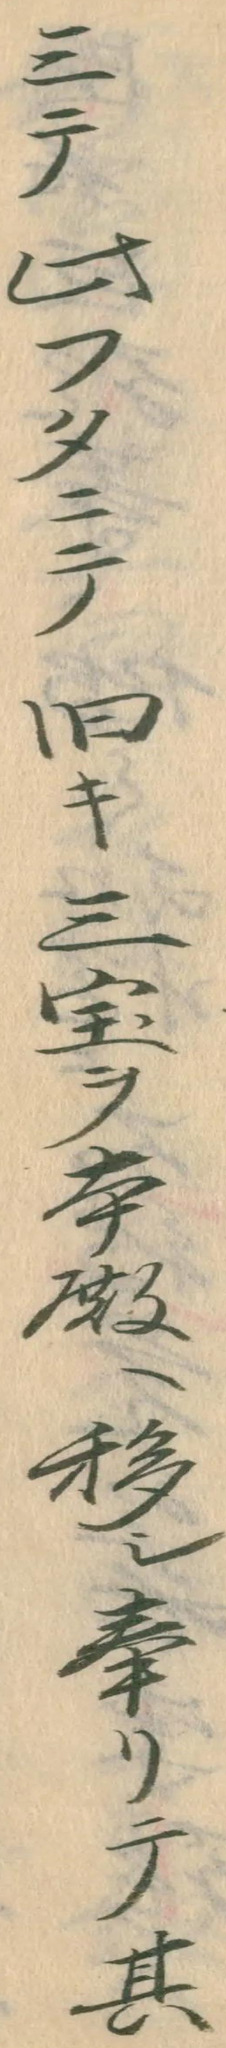ミテ此フタニテ旧キ三宝ヲ本殿ヘ移シ奉リテ其
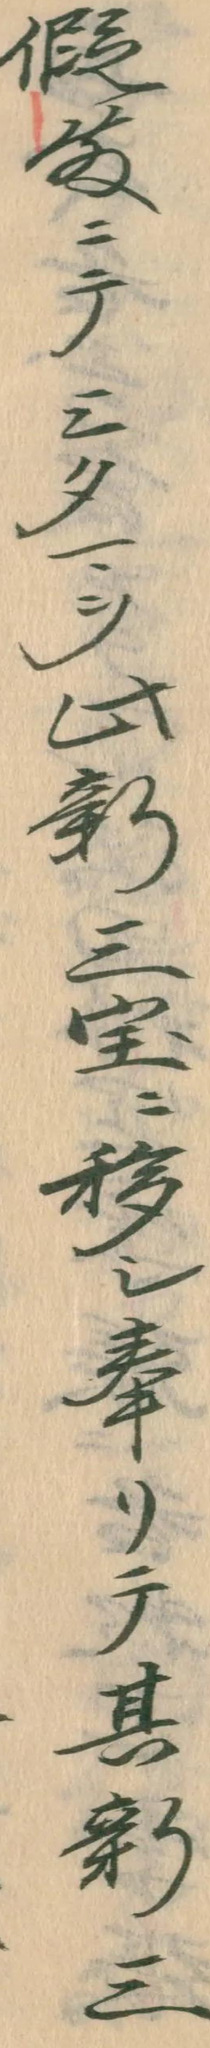仮_殿ニテミタマヲ此新三宝ニ移シ奉リテ其新三
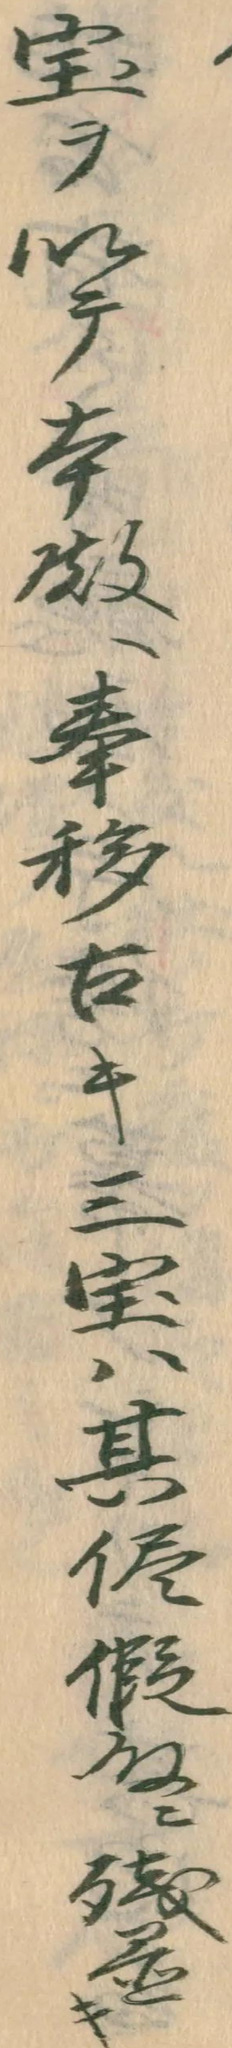宝ヲ以テ本殿ヘ奉移古キ三宝ハ其侭仮殿ニ残置キ
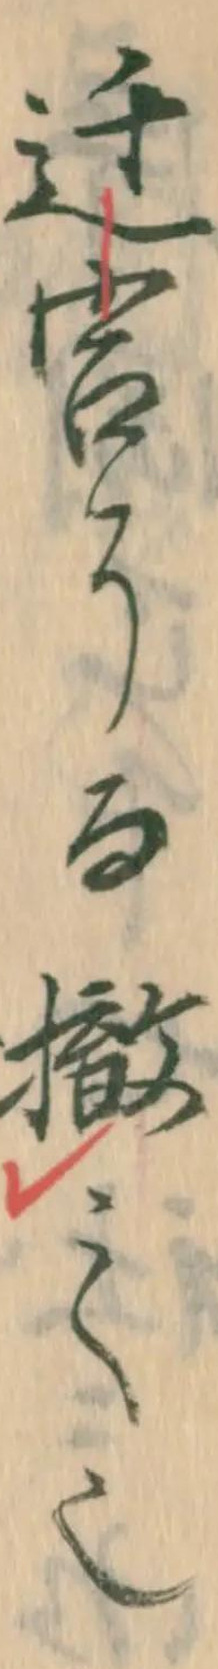迁-宮了而撤之也
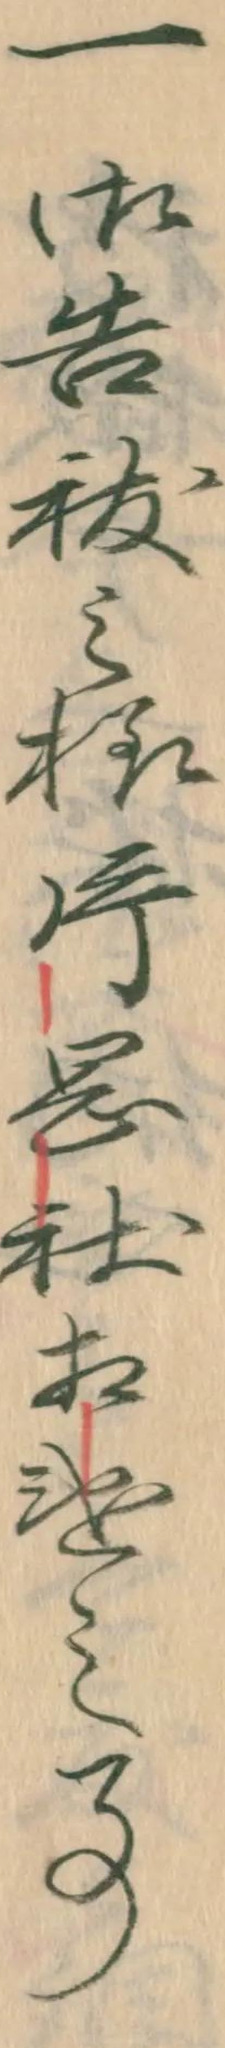一御告祓之様片_岡_社相-遣之事
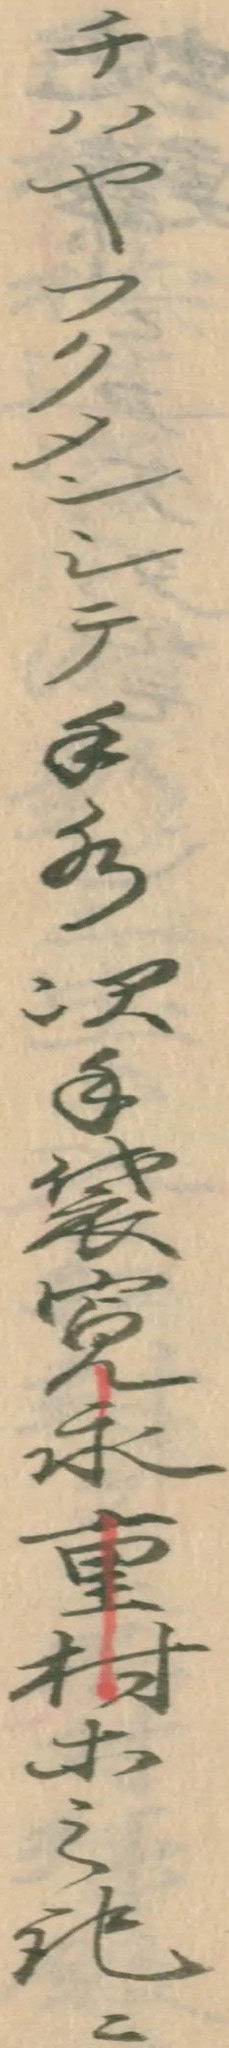チハヤフクメンシテ手水次手袋寛-永重村等之記ニ
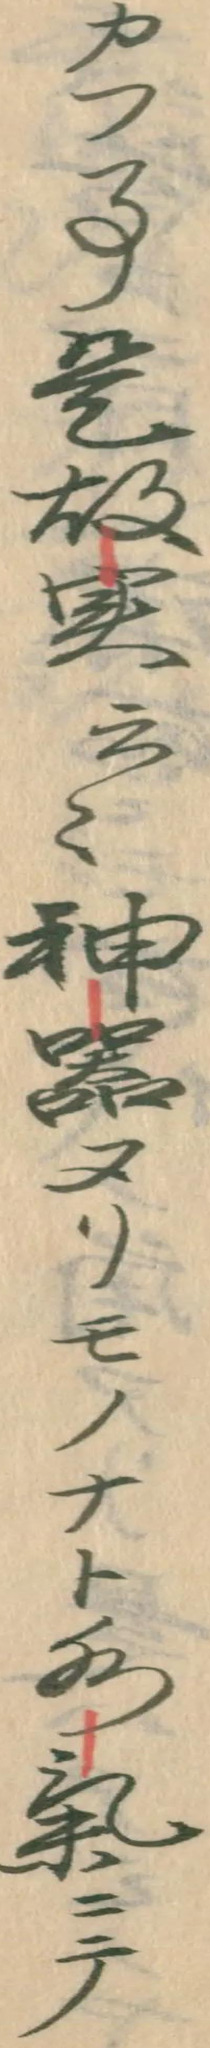カフ事是故-実云々神-器ヌリモノナト水-気ニテ
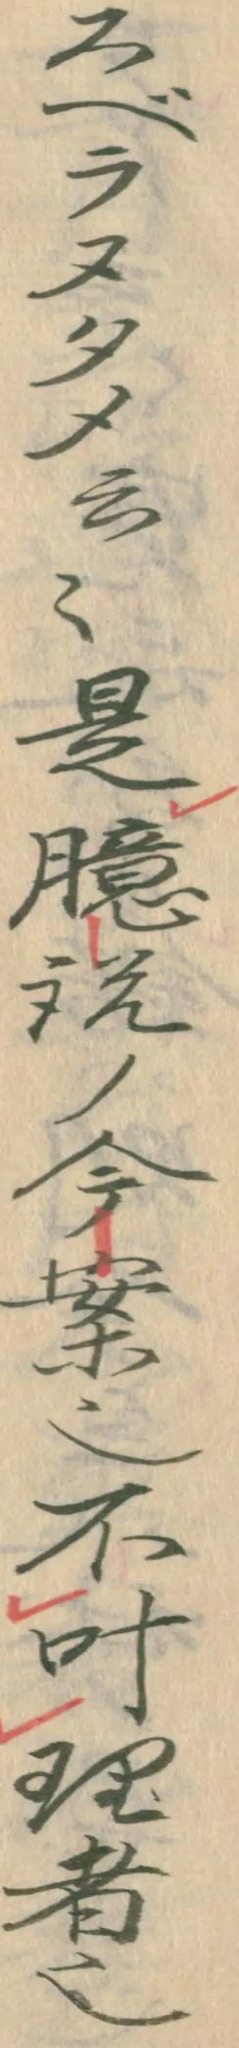スベラヌタメ云々是臆-説ノ今-案也不叶理者也
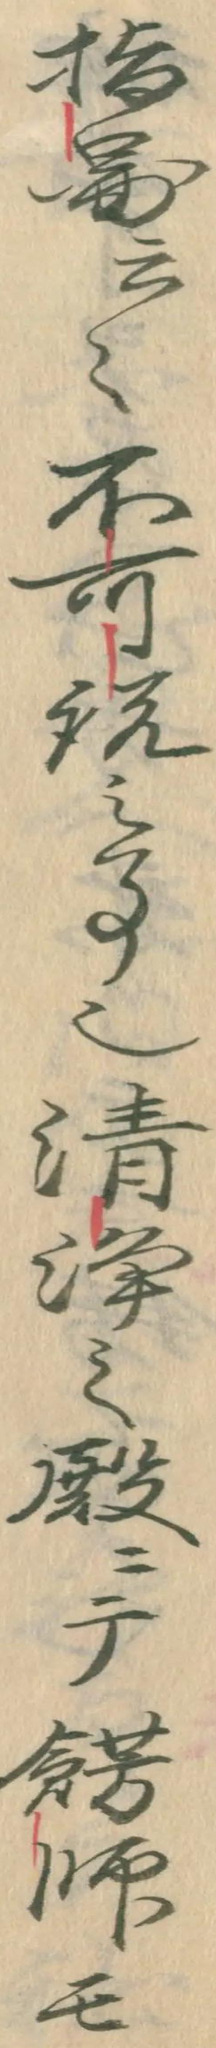指_図云々不-可-説之事也清-浄之殿ニテ錺_師モ

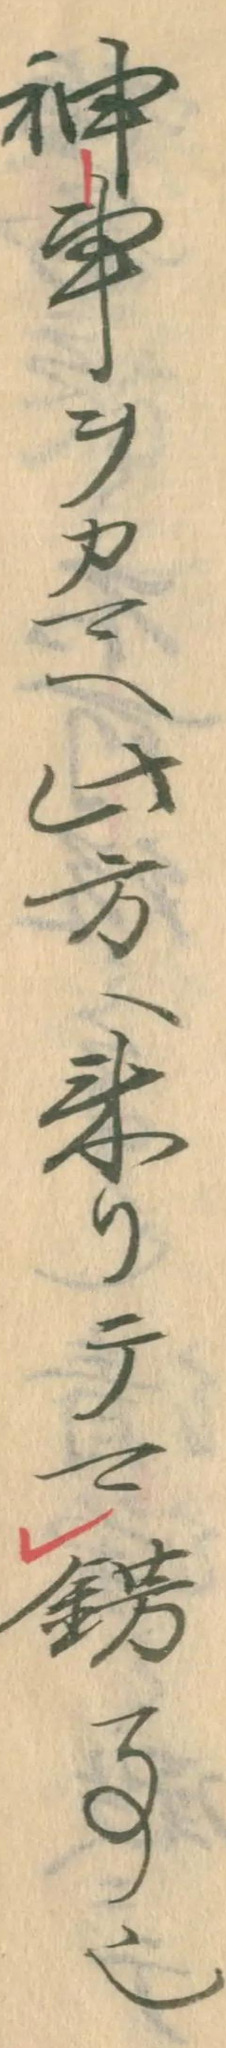神-事ヲカマヘ此方へ来リテ可錺事也
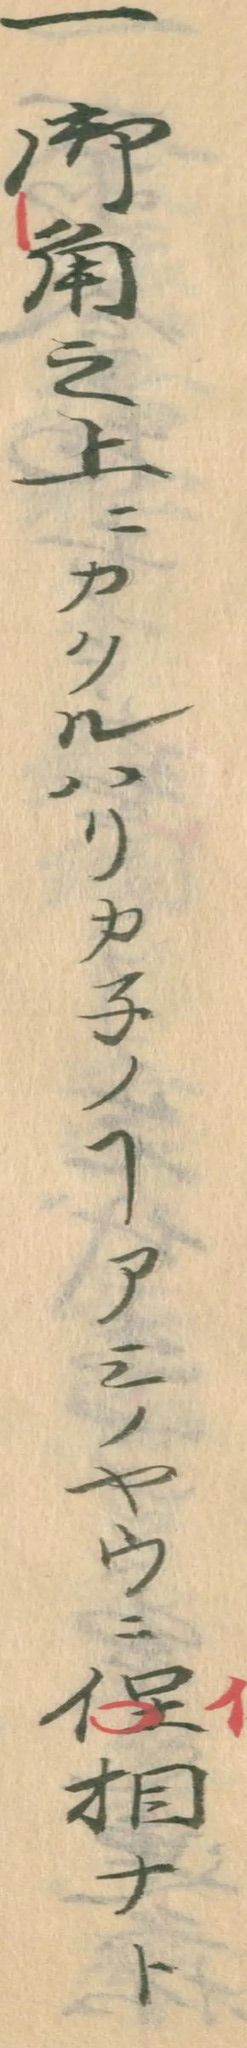一御_角之上ニカクルハリカネノコトアミノヤウニ保ナト
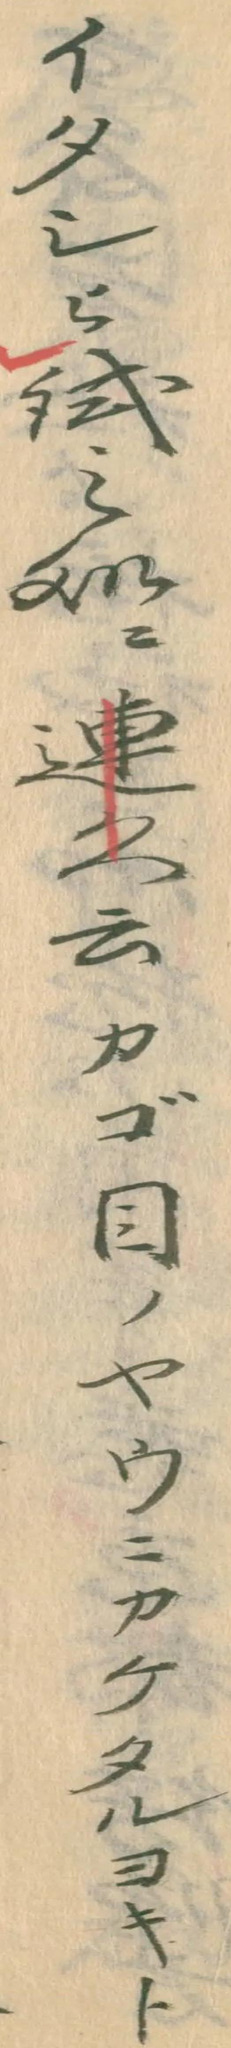イタシ被試之処ニ連久云カゴ目ノヤウニカケタルヨキト
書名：賀茂社記録. 第16冊
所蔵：国立国会図書館 National Diet Library, JAPAN
